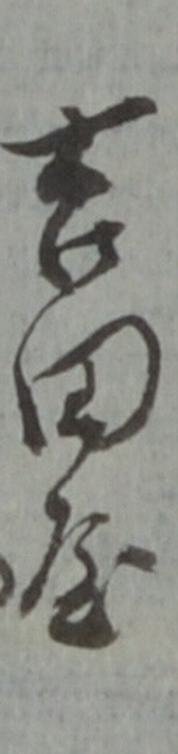吉田屋
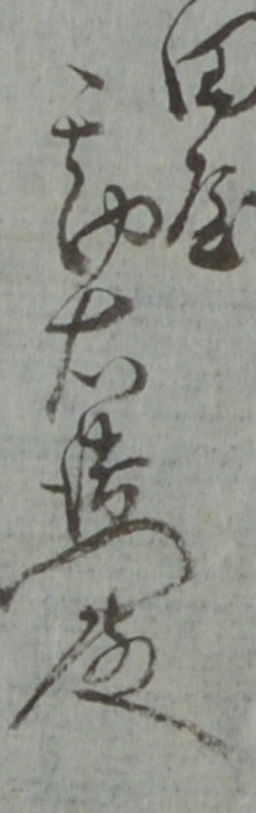勘右衛門殿

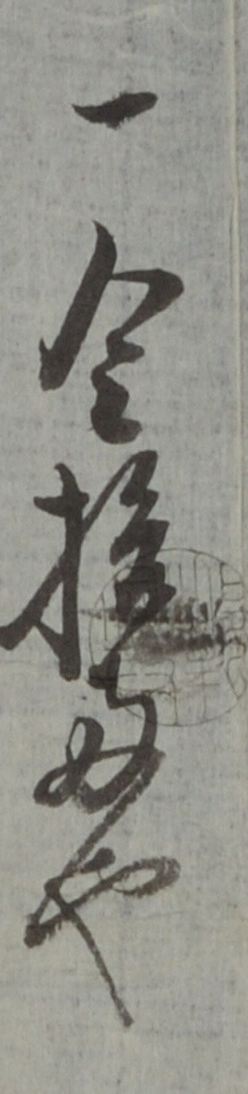一金拾両也
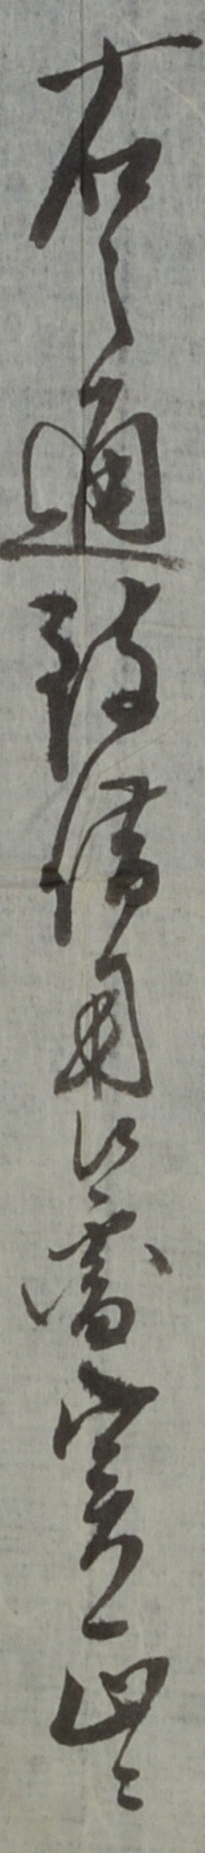右之通致借用候処実正ニ
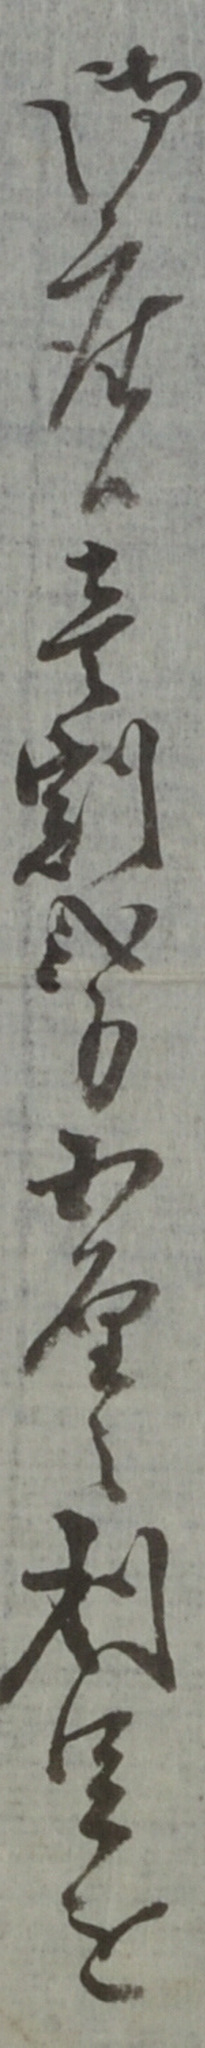御座候壱割弐分五厘之利足を
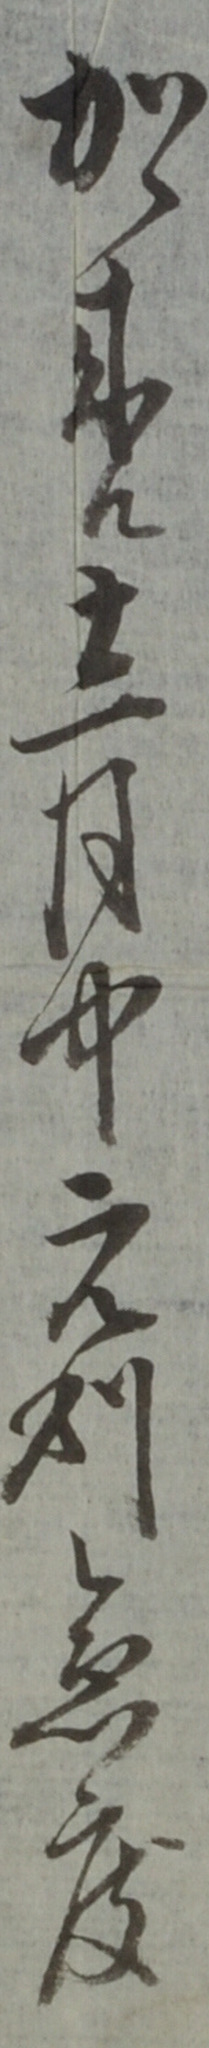加へ来ル十二月中元利急度
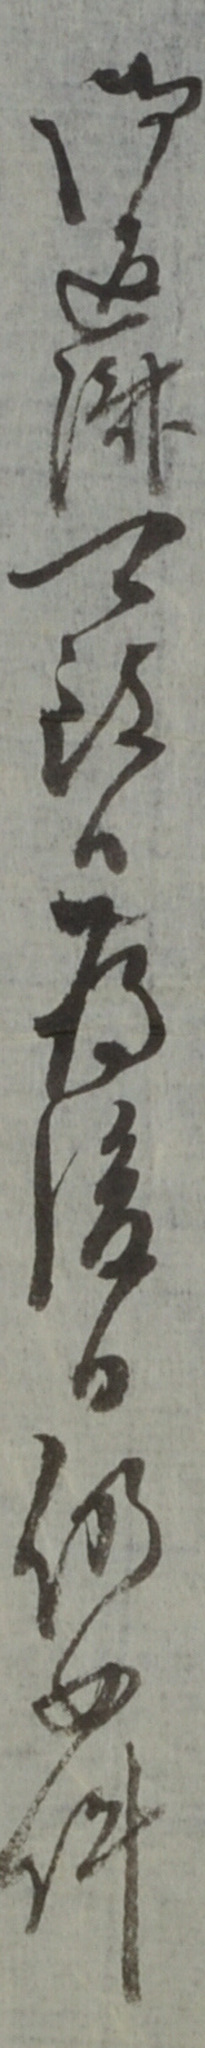御返済可致候為後日仍如件
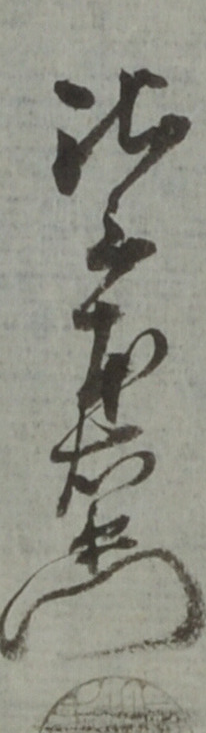池上本右衛門㊞
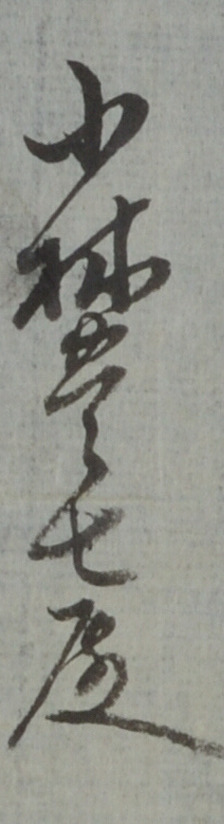小林豊七殿

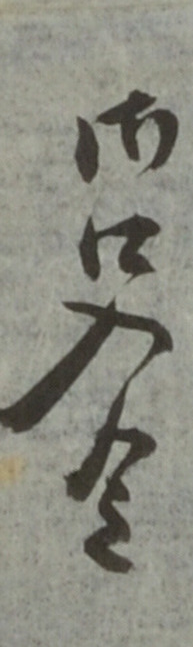御口入金
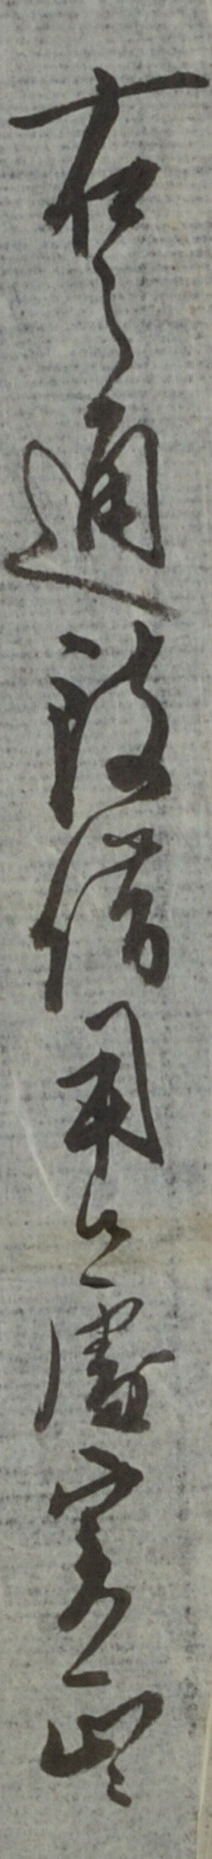右之通致借用候処実正ニ
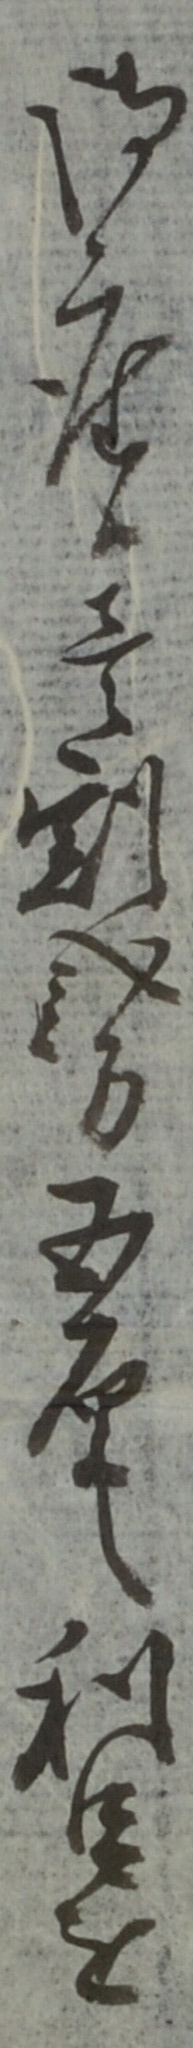御座候壱割弐分五厘之利足を
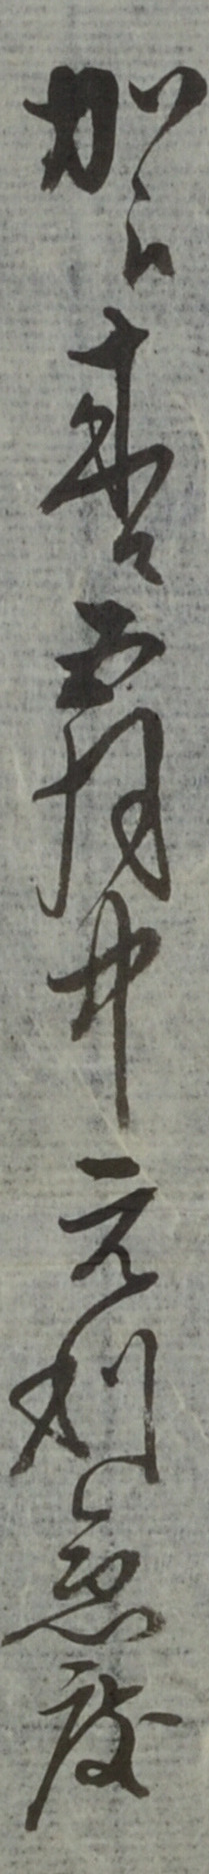加江来ル五月中元利急度
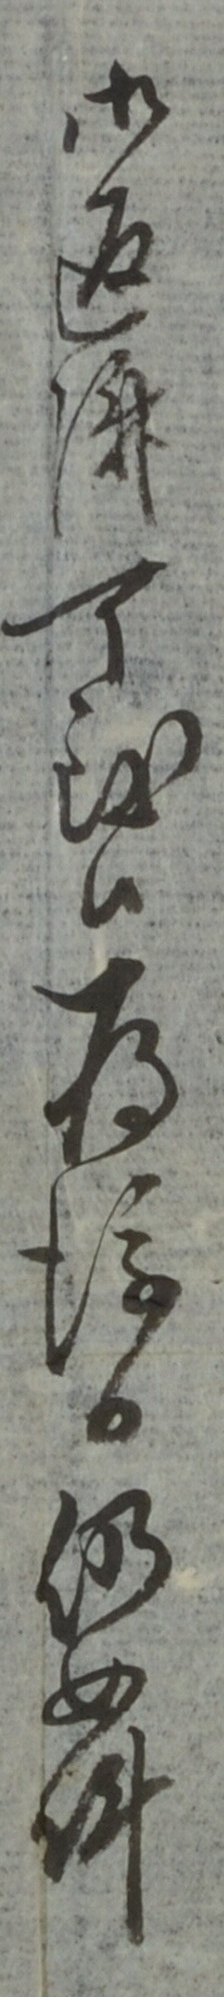御返済可致候為後日仍如件
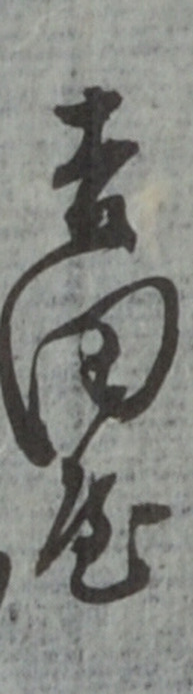吉田屋
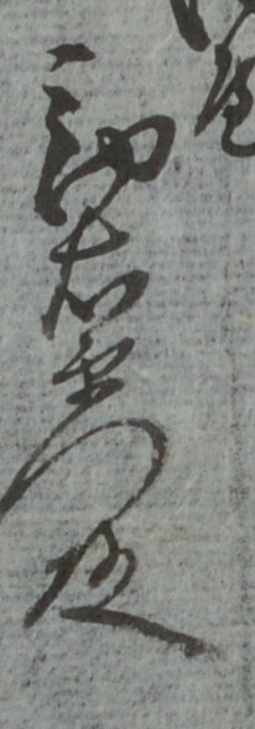勘右衛門殿
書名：拝借證文之事
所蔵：伊那市立高遠町図書館・合同会社AMANE
